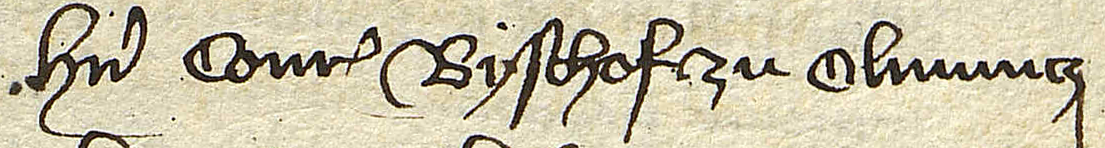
hn* Conr* Byſchof cʒu Olmuncʒ
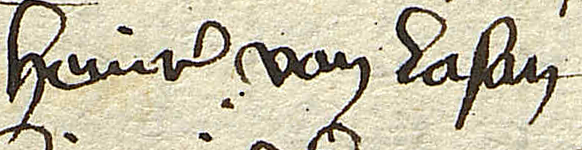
heinr* von Laſan
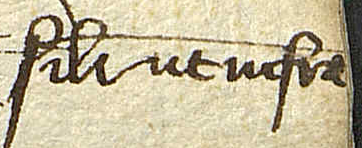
ſilr* ut infra
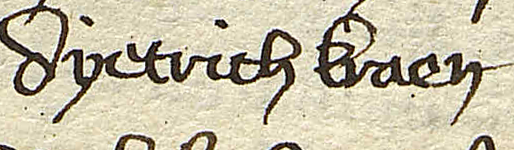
Dyetrich kraen
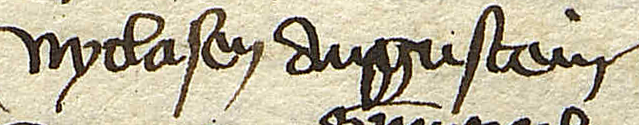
Nyclaſen Auguſtein
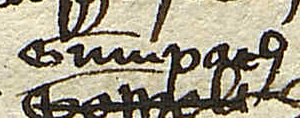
Gumpach
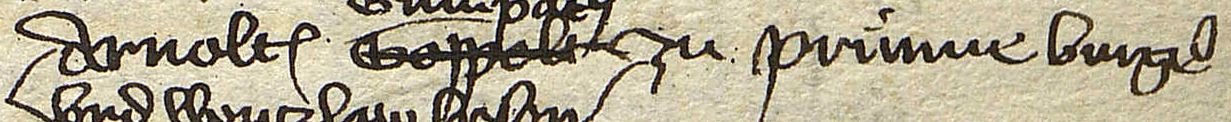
Arnolt* Goppelt cʒu Prünne burge*
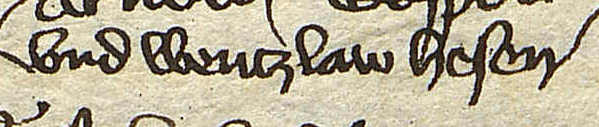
vnd wencʒlaw heſen
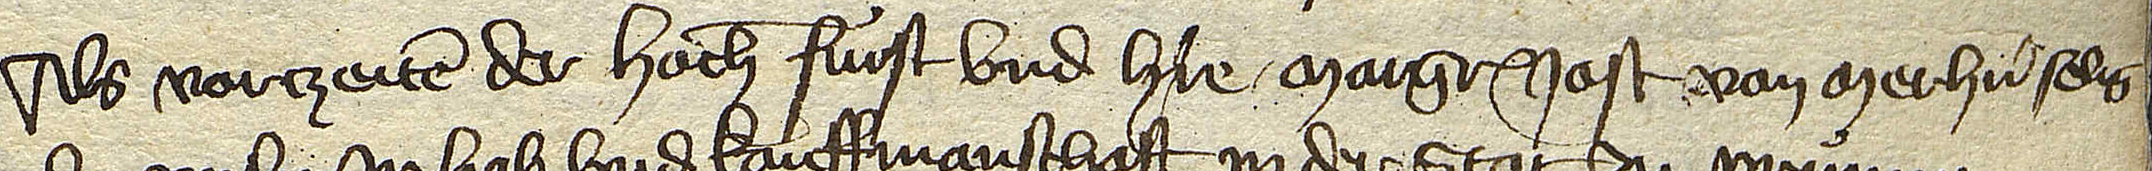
Als vorcʒeite* der hoch* fürſt vnd h*re / Margr* Ioſt von Merhn* ſelig
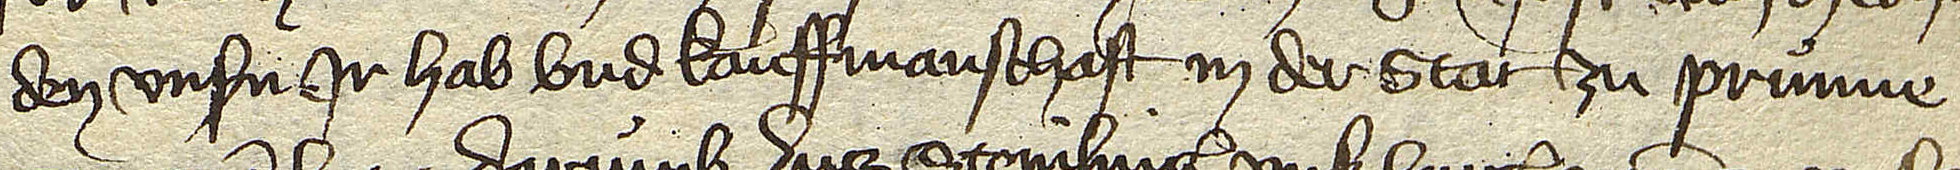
den vnſ*n hab vnd kauffmanſchaft in der Stat cʒu Prünne
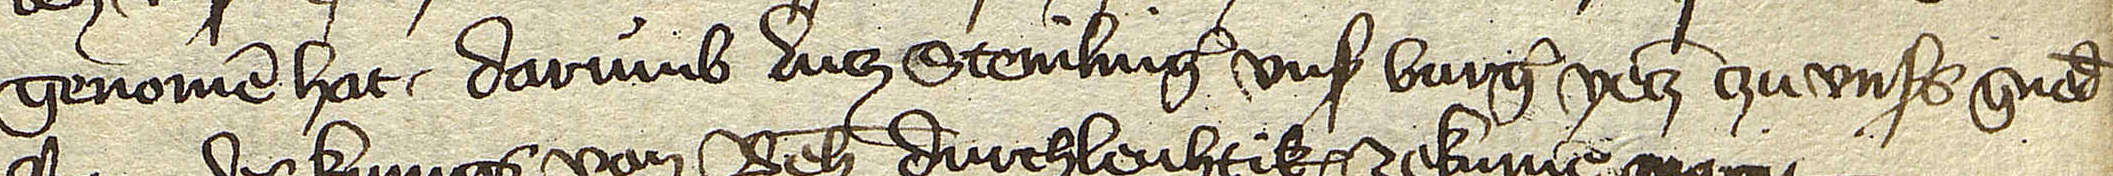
genome* hat / darümb Lucʒ Steinling vnſ* burg* yecʒ* cʒu vnſ*s gned*
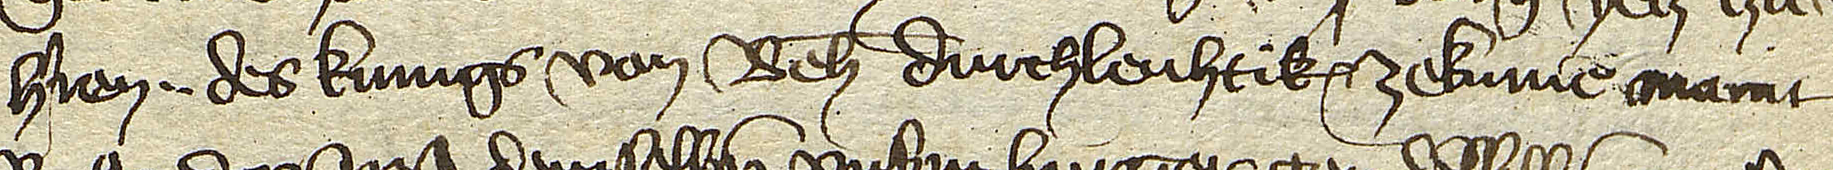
h*ren ~ des kunigs von Beh* durchleuhtik* cʒekume* maint
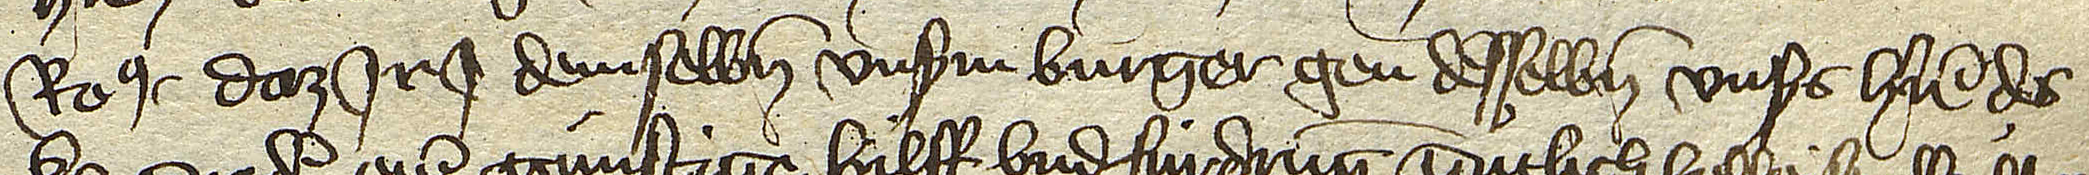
Ro* / daʒ Ir demſelbn* vnſ*m burger gen de*ſſelbn* vnſ*s h*re* des
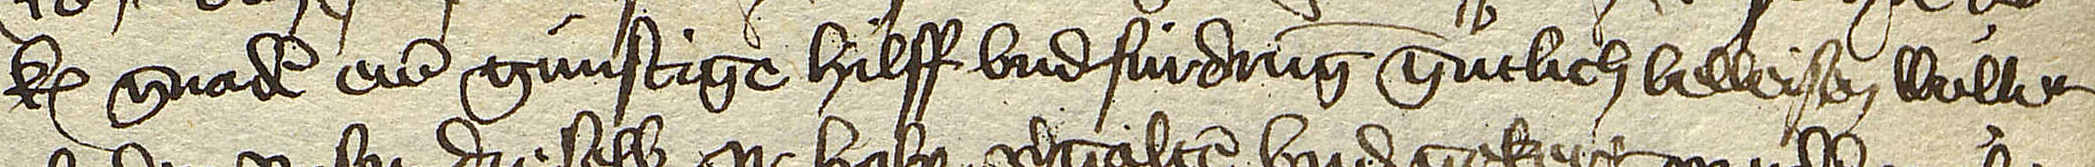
k* gnad* ew* günſtige hilff vnd fürdrug* gütlich beweiſen wöllet
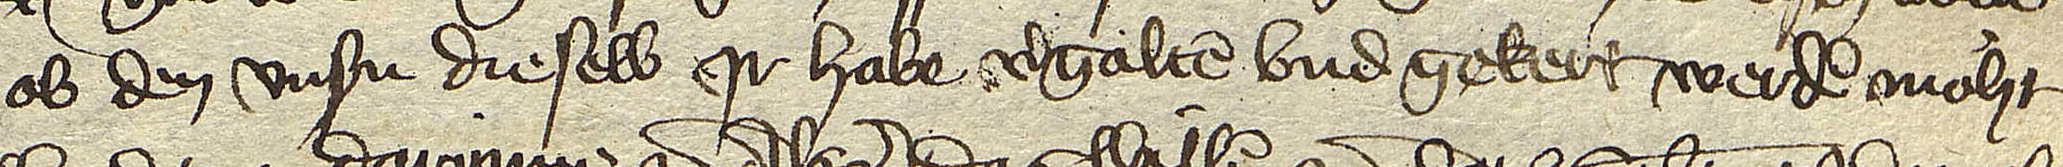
ob den vnſ*n dieſelb Ir habe v*golte* vnd gekert werd* möht
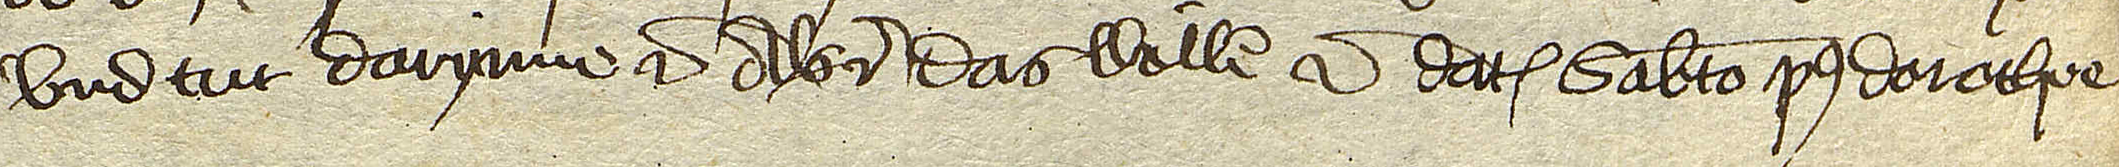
vnd tut darynne ec* Als ec* Das wölle ec* dat* Sabto* p* darothee
